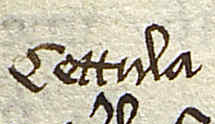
Cettula
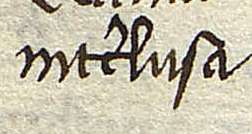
int*cluſa
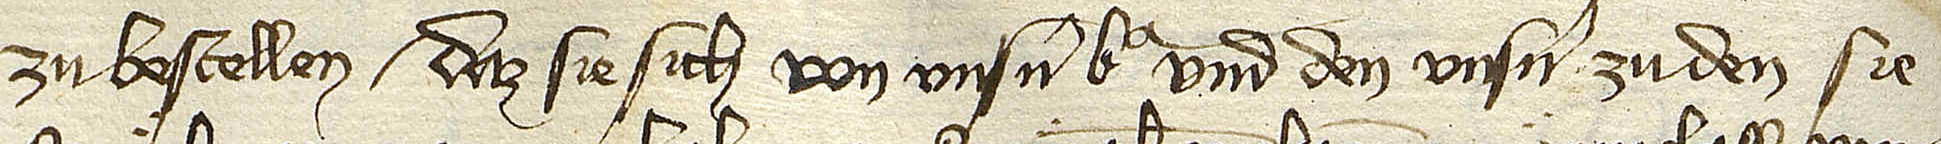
ʒu beſtellen / daʒ ſie ſich von vnſn* b* vnd den vnſn* ʒu den ſie
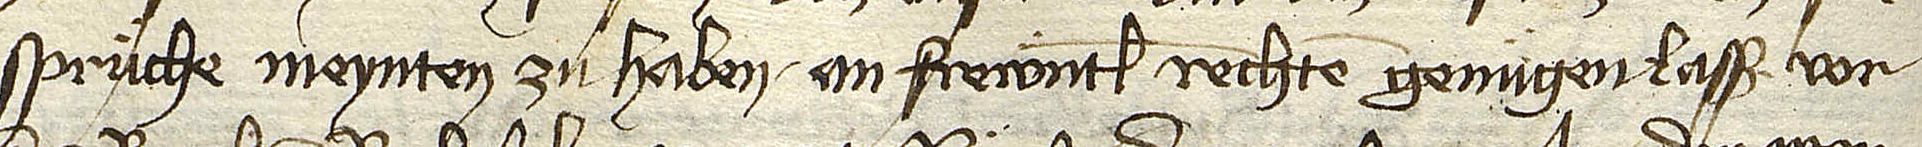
ſprüche meynten ʒu haben / an freẅntl* rechte* genügen laſſ* . vor
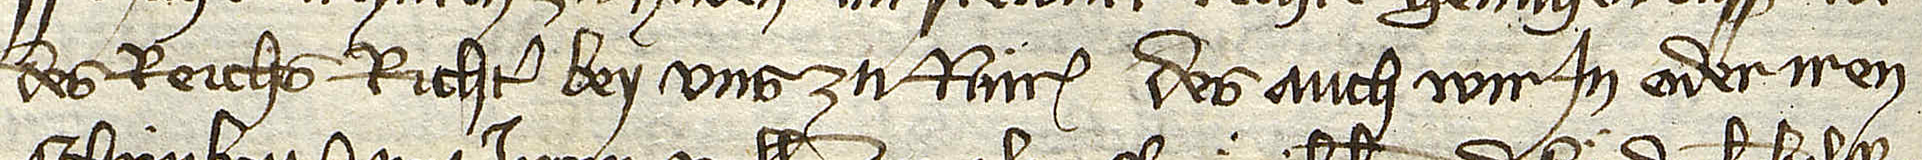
des Reichs Richt* bey vns ʒu Nür* des auch wir In oder iren
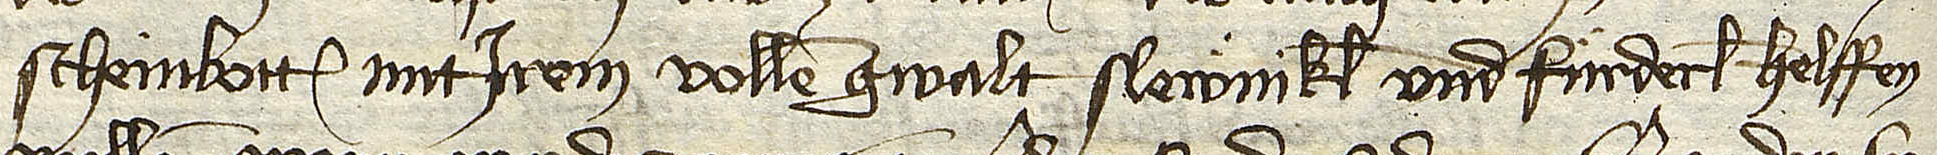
ſcheinbott* mit Irem volle* gwalt ſleẅnikl* vnd fürderl* helffen
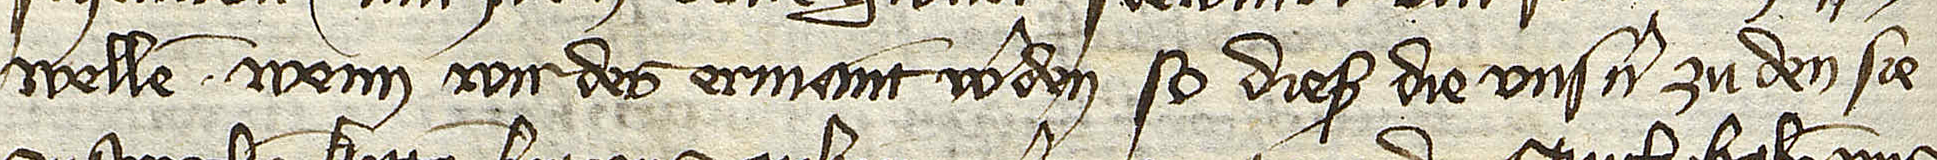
welle* . wenn wir des ermant* wden* ſo dieſ* die vnſn* ʒu den ſie
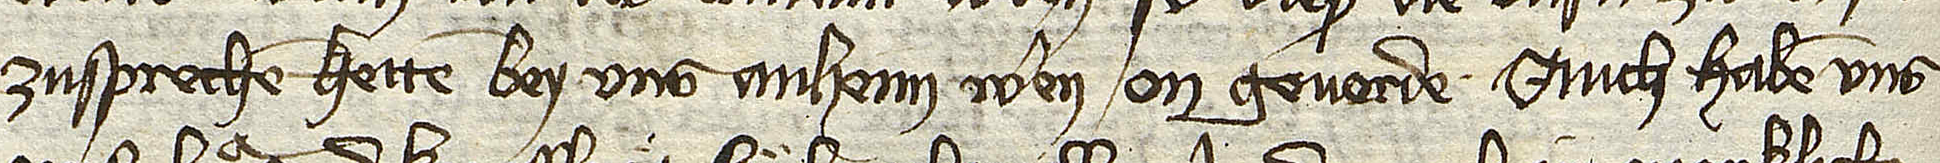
ʒuſpreche* hette* bey vns anheim wen* on geuerde . / Auch habe* vns
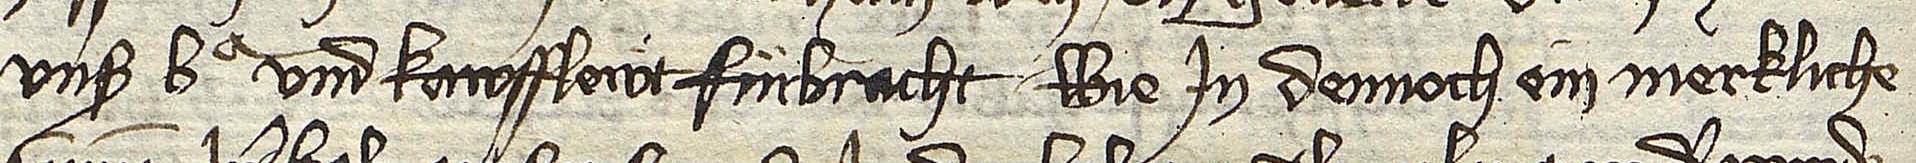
vnſ* b* vnd kauffleẅt fürbracht / Wie In dennoch ein merkliche
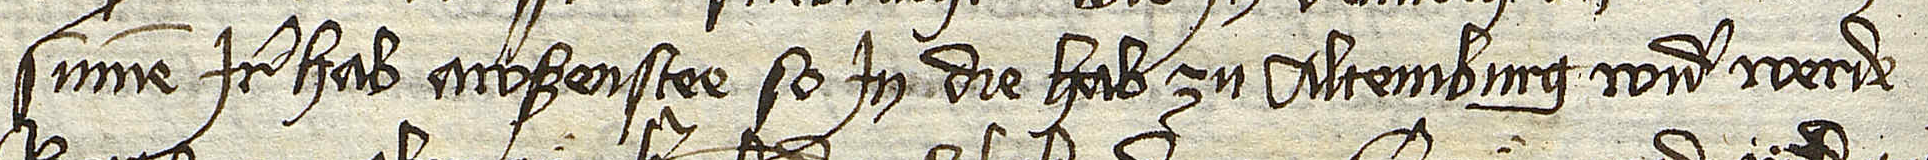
ſume* Ir hab awſʒenſtee ſo In die hab ʒu Altemburg wid* werde
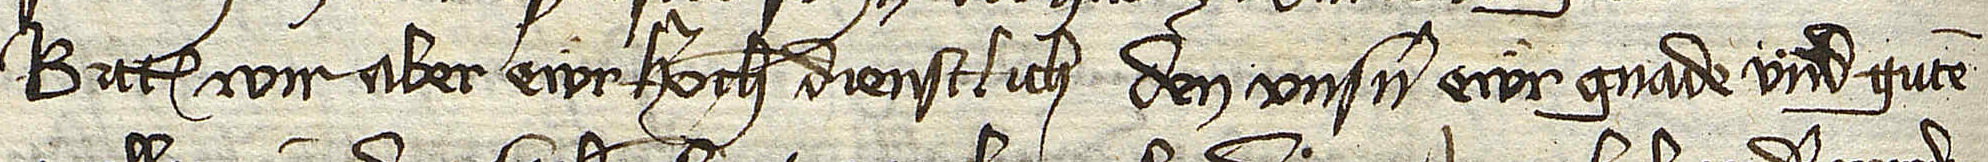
Bitt* wir aber eẅr Hoch* dienſtlich den vnſn* eẅr gnade vnd gute*
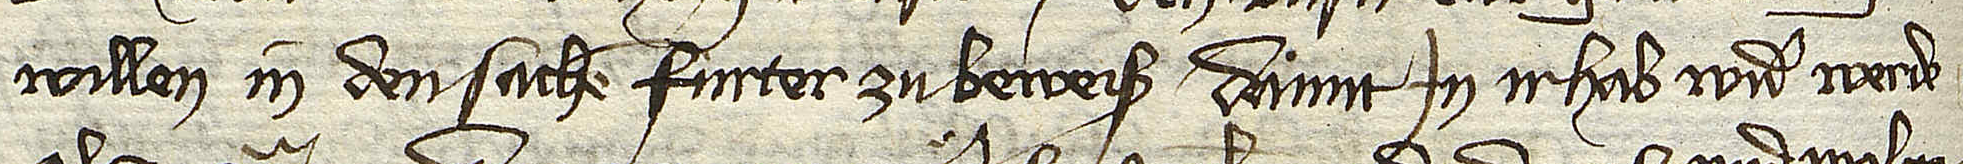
willen in den ſache* fürter ʒu beweiſ* / Damit In ir hab wid* werde
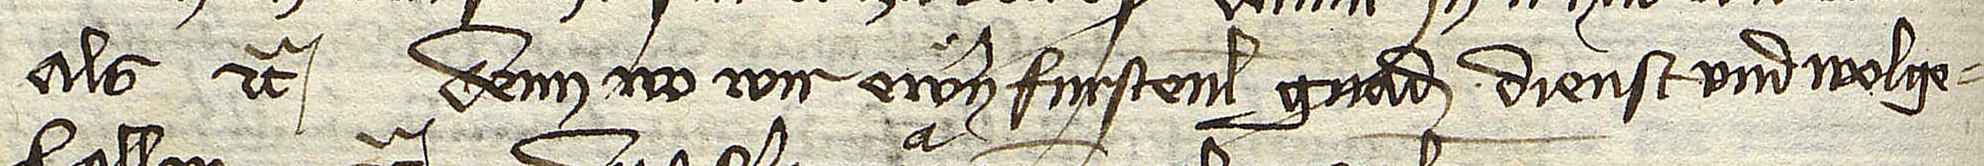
als ec* Denn wo wir eẅn* furſtenl* gnad* . dienſt vnd wolge =
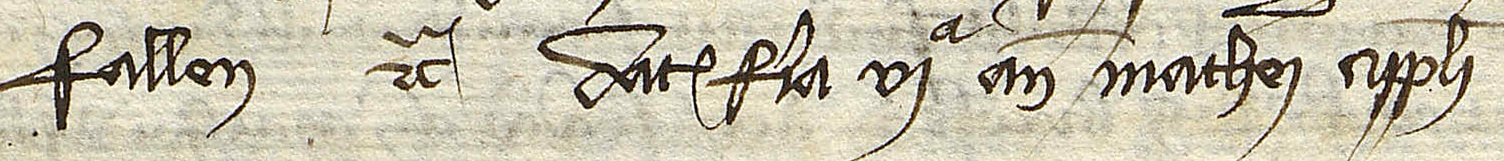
fallen ec* Dat fia* vi* an* mathei appli*
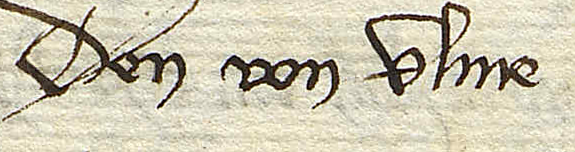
Den von Vlme
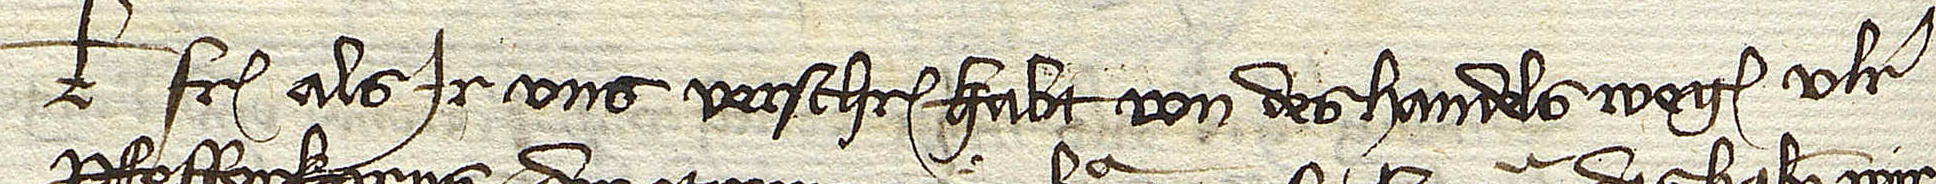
L* fr* als Ir vns verſchr* habt von des handels weg* vlr*
